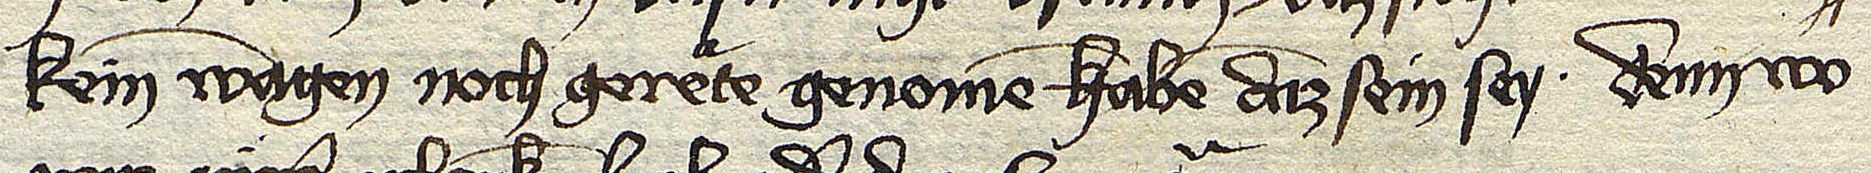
kein* wagen noch gerëte* genome* habe* daʒ ſein ſey . Denn wo
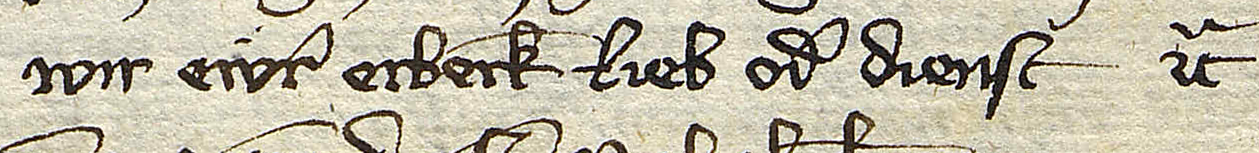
wir ewr* erberk* lieb od* dienſt ec*
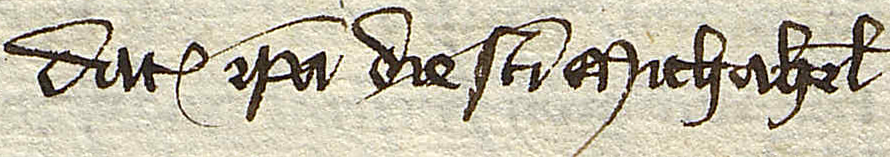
Dat* ipa* die ſci* Michahel*
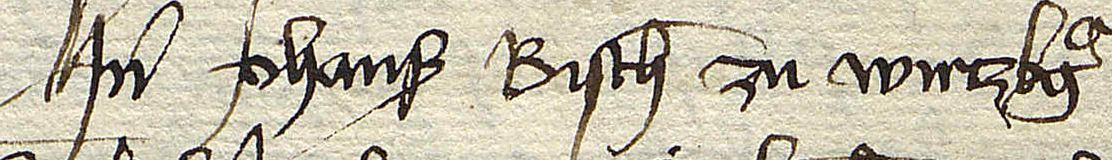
Hn* Iohanſ* Biſch* ʒu wircʒb*g
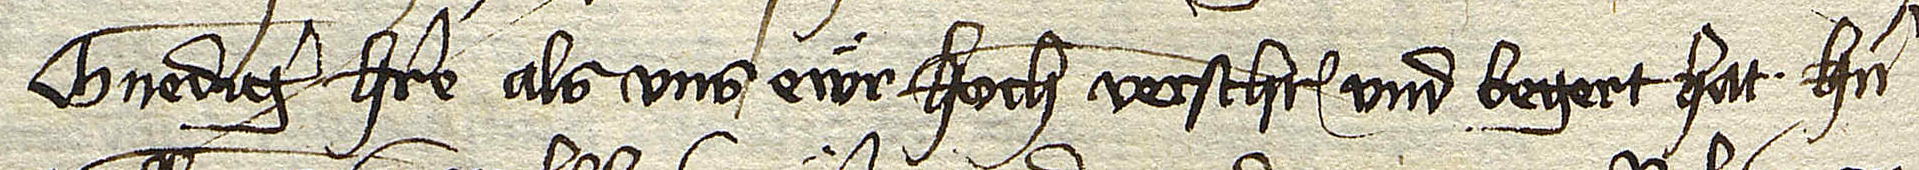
Gnedig* hre* als vns ewr Hoch* verſchr* vnd begert hat . h*n
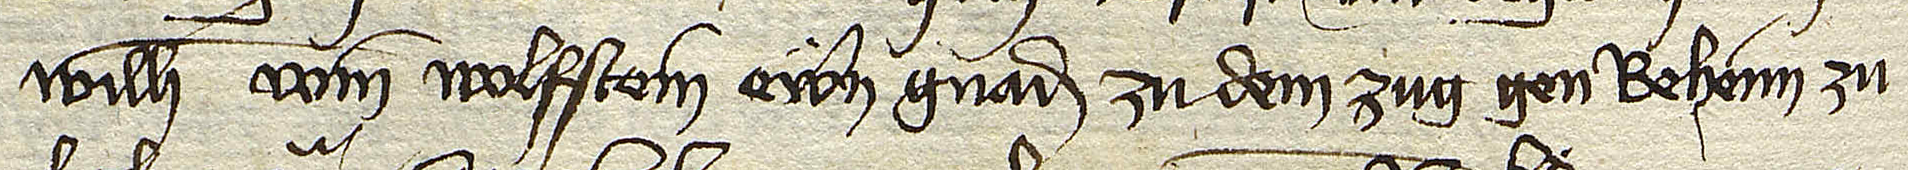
wilh* vom* wolfſtein ewn* gnad* ʒu dem ʒug gen Beheim ʒu
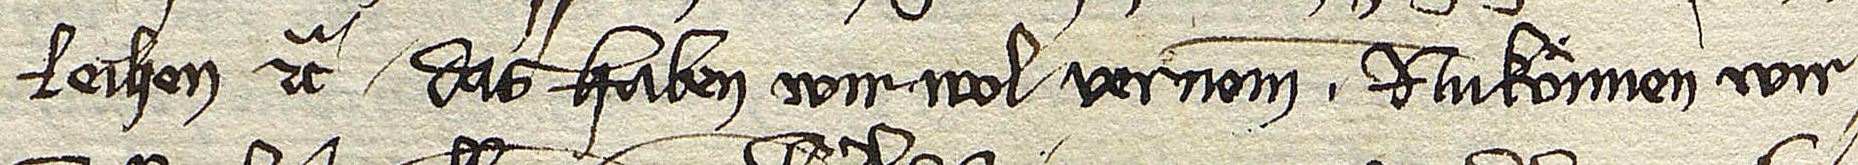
leihen ec* / das haben wir wol vernom* . Nu können wir
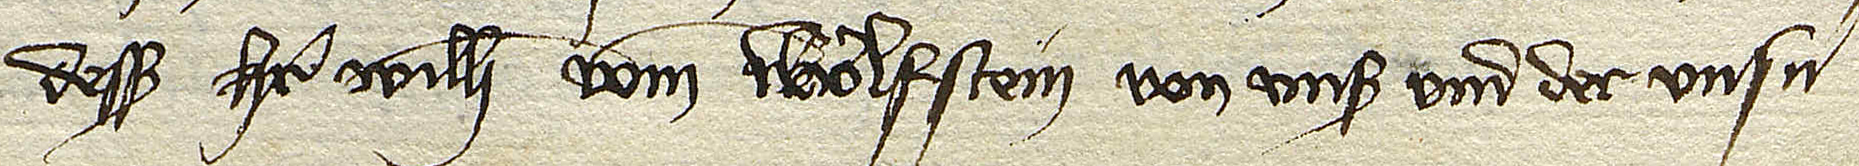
deſſ* hr* wilh* vom Wölfſtein von vnſ* vnd der vnſ*n
